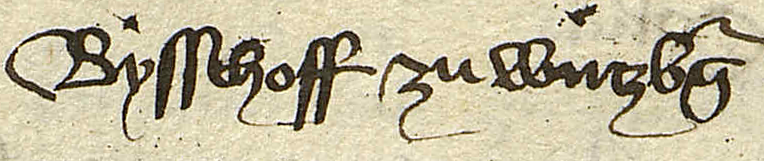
Byſſchoff cʒu wircʒb*g
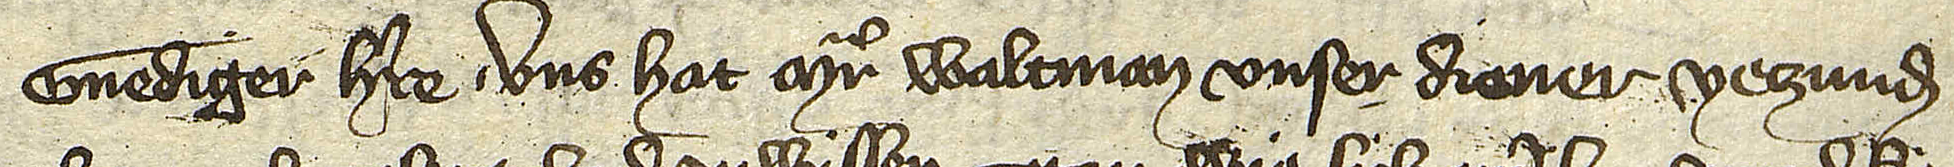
Gnediger h*re / Vns hat Mr* waltman vnſer diener yecʒund*
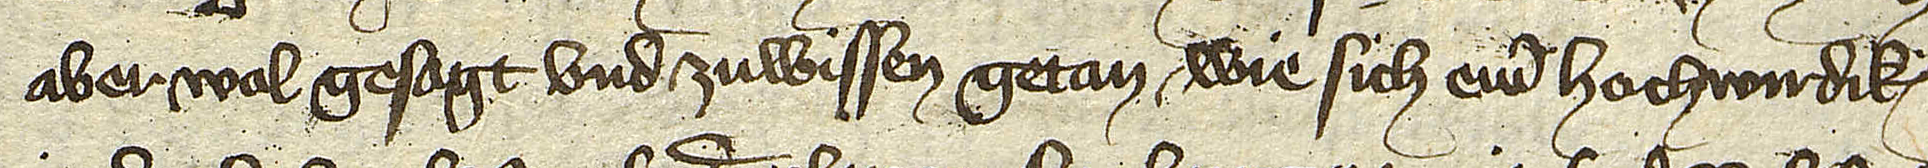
aber wol geſagt vnd cʒuwiſſen getan / wie ſich ew* hochwirdik*
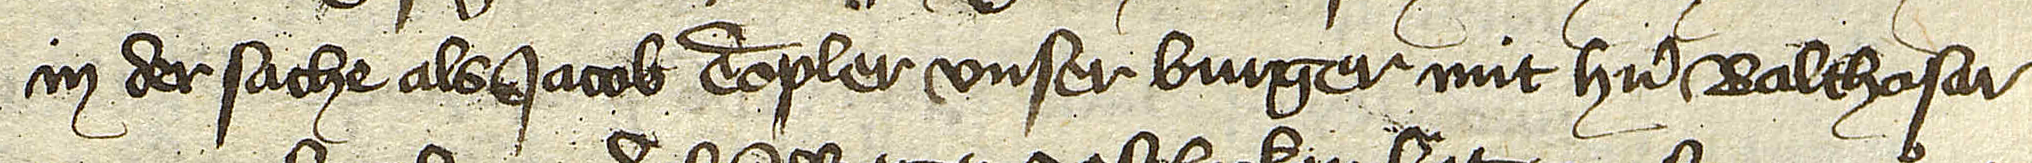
in der ſache als Iacob Topler vnſer burger mit hn* Balthaſar
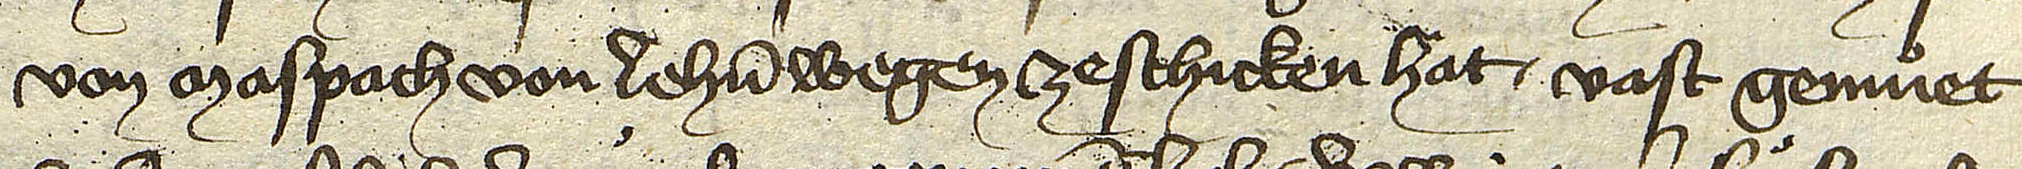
von Maſpach von lehn* wegen cʒeſchicken hat / vaſt gemüet
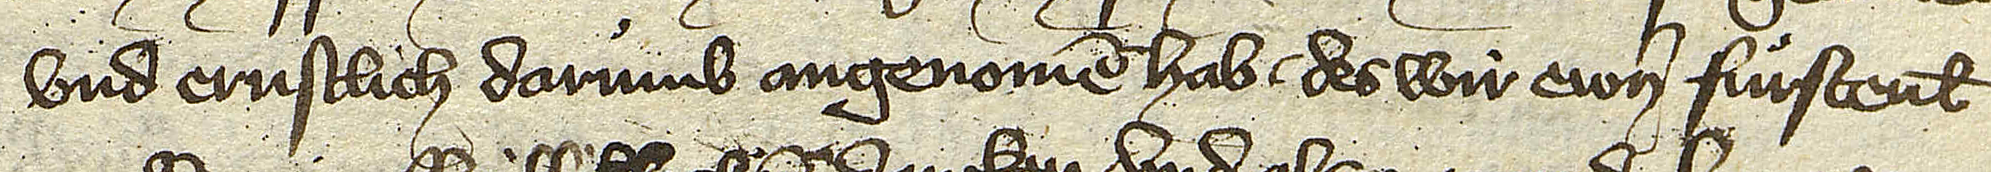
vnd ernſtlich darümb angenome* hab / des wir ewn* fürſtenl*
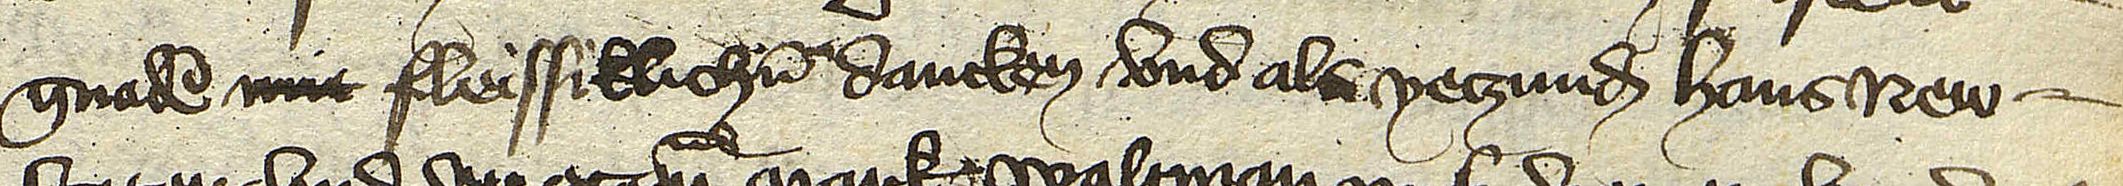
gnade* mit fleiſſiklichn* dancken / vnd als yecʒund* hans New =
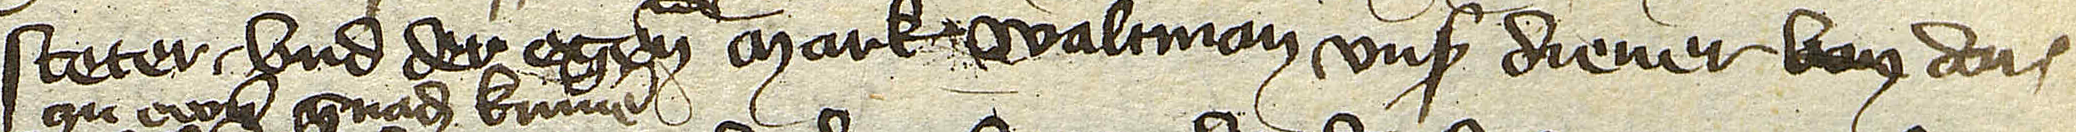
ſteter / vnd der egen* Mark* waltman vnſ* diener von dar*
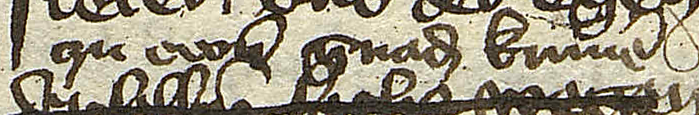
cʒu ewn* gnad* kume*
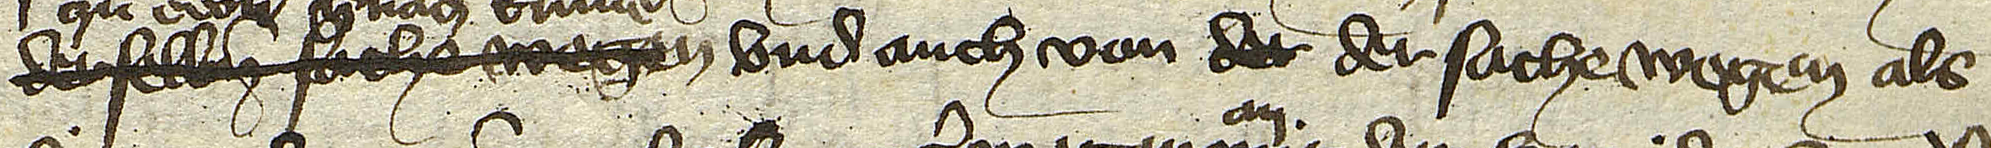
derſelbn* ſache wegen vnd auch von der der ſache wegen als
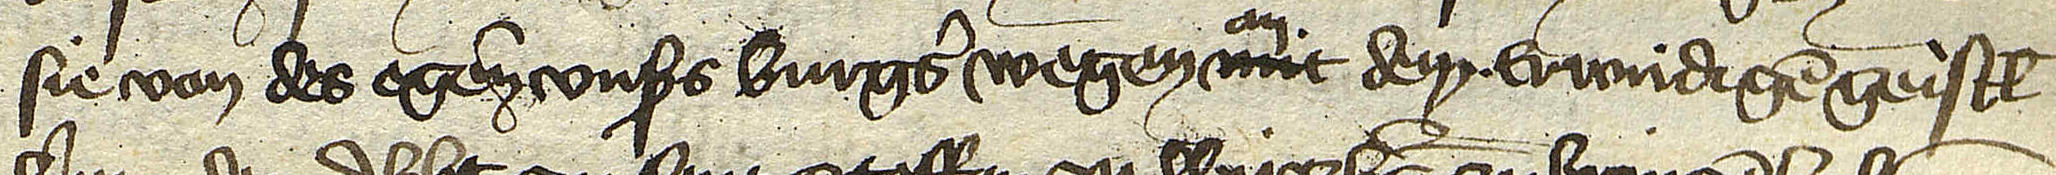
ſie von des egen* vnſ*s burgs* wegen mit den ~Erwirdige* geiſtl*
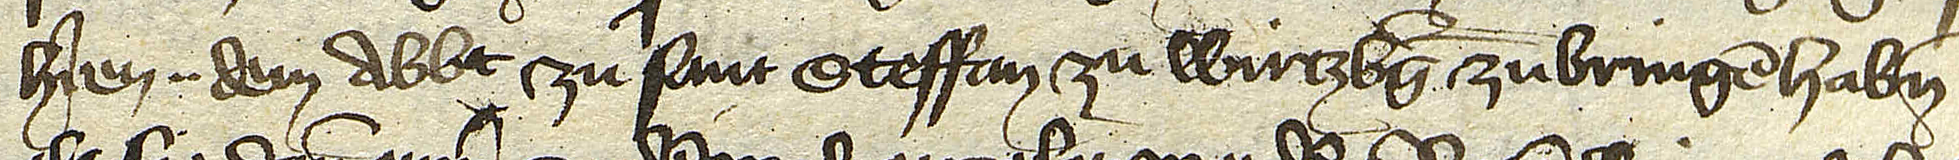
hr*en ~ dem Abbt cʒu ſant Steffan cʒu wircʒb*g cʒubringe* habn*
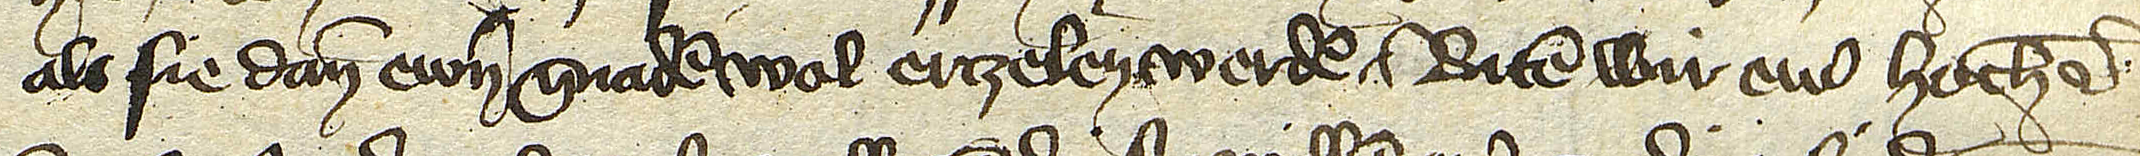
als ſie dan* ewn* gnade* wol ercʒelen werde* / Bite* wir ew* hoch* ec*
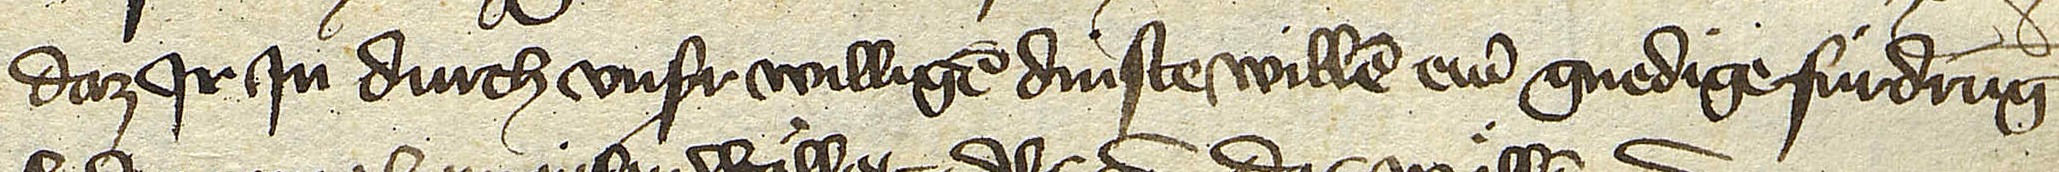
daʒ Ir In durch vnſ*r willige* dinſte wille* ew* gnedige fürdrug*
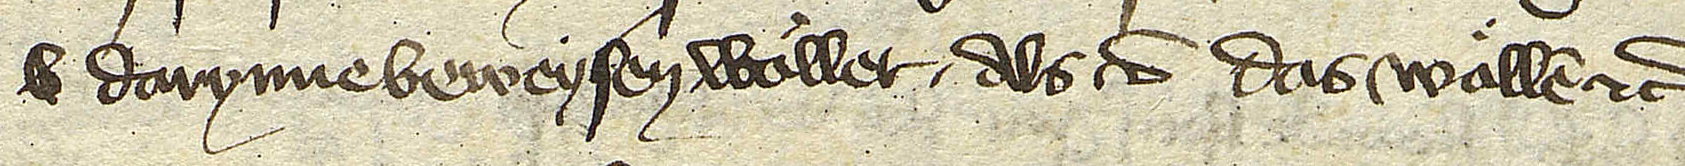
b darynne beweyſen wöllet / Als ec* das wölle* ec*
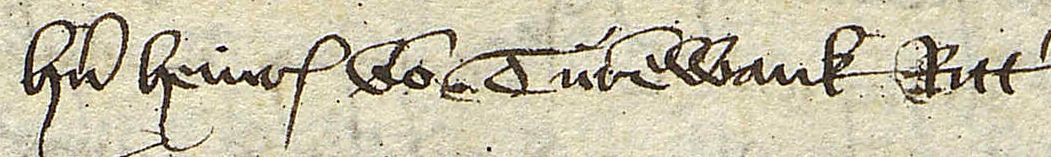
hn* heinr* vo* Türe*wank Ritt*
